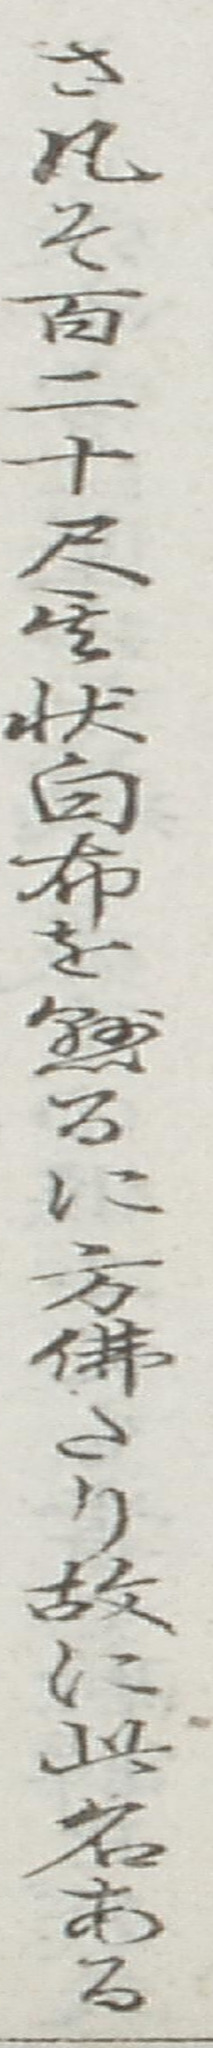さ凡そ百二十尺其状白布を懸るに方仏たり故に此名ある
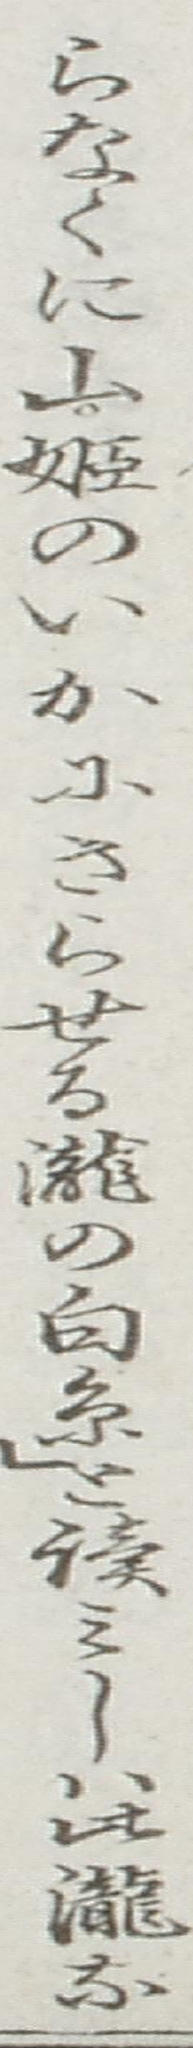らなくに山姫のいかにさらせる瀧の白糸」と読みしは此瀧な
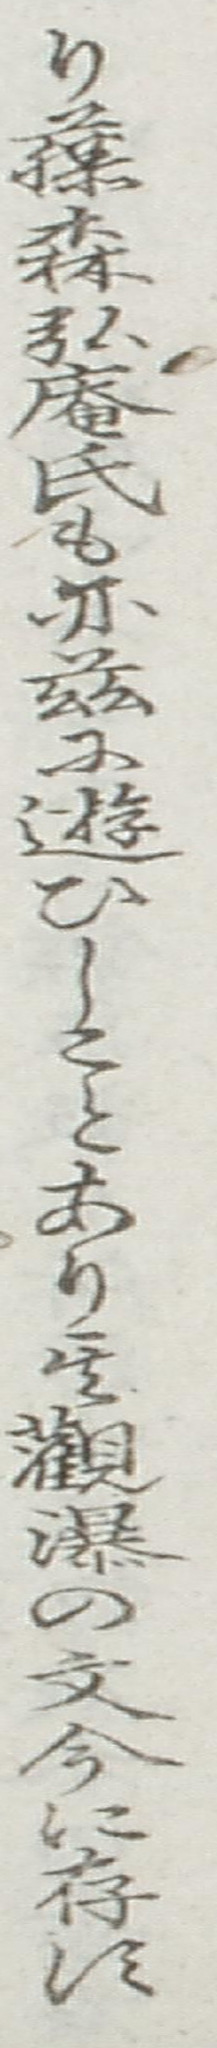り藤森弘庵氏も亦茲に遊ひしことあり其観瀑の文今に存す

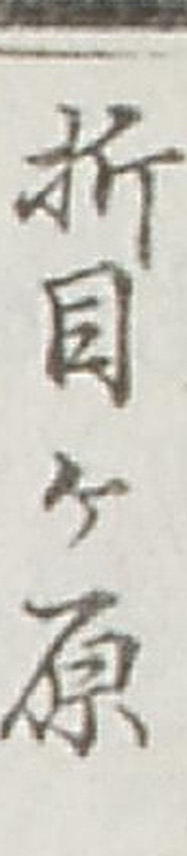折目ヶ原
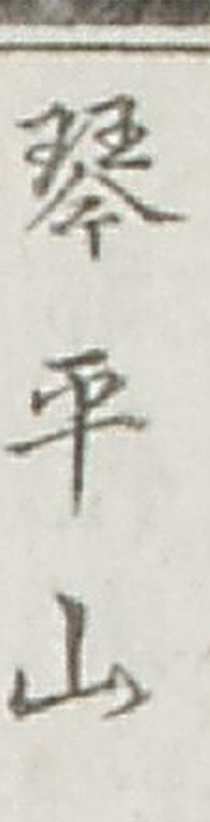琴平山
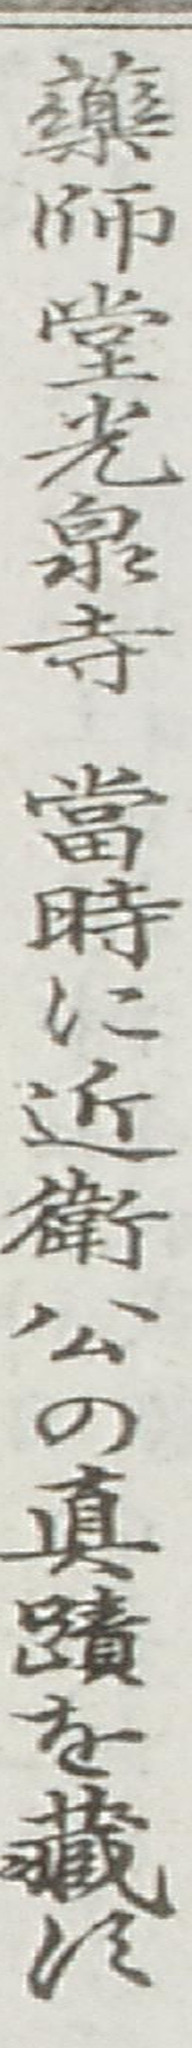薬師堂光泉寺当時に近衛公の真跡を蔵す
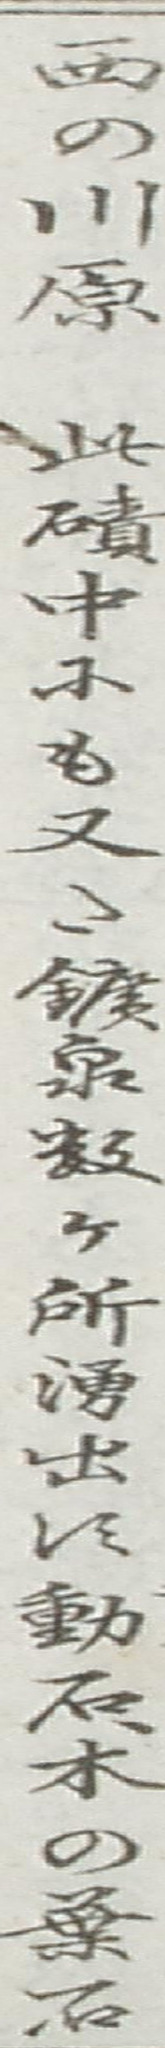西の川原此磧中にも又ゝ鉱泉数か所湧出し動石、木の葉石
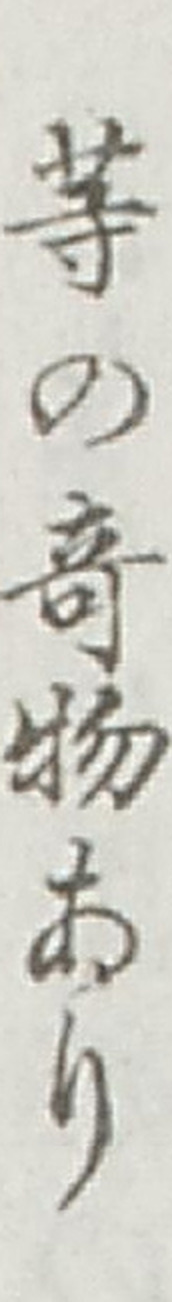等の奇物あり
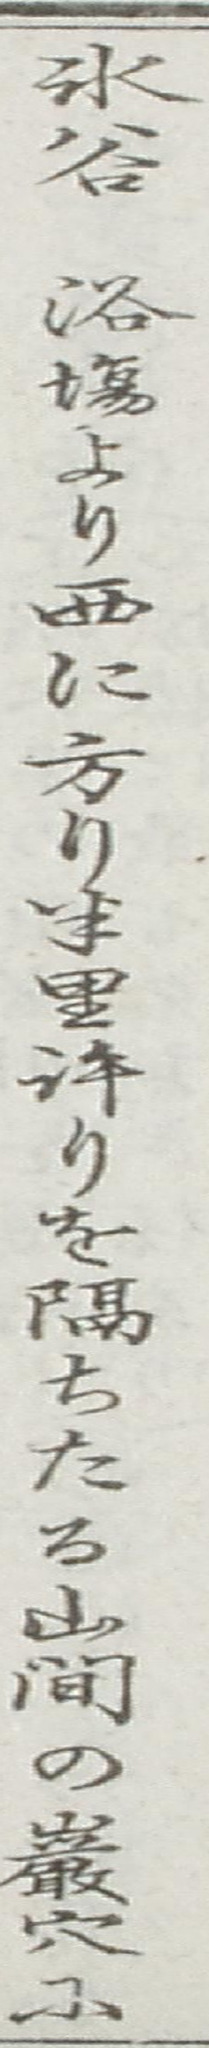氷谷浴場より西に方り半里許りを隔ちたる山間の岩穴に
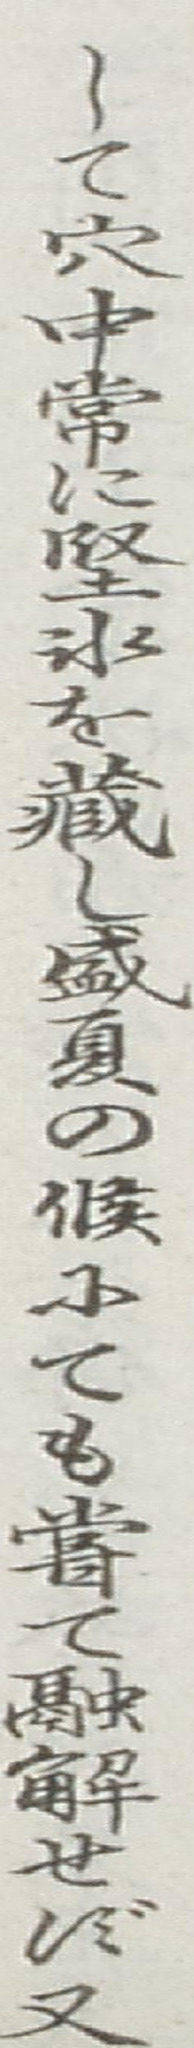して穴中常に堅氷を蔵し盛夏の候にても嘗て融解せず又
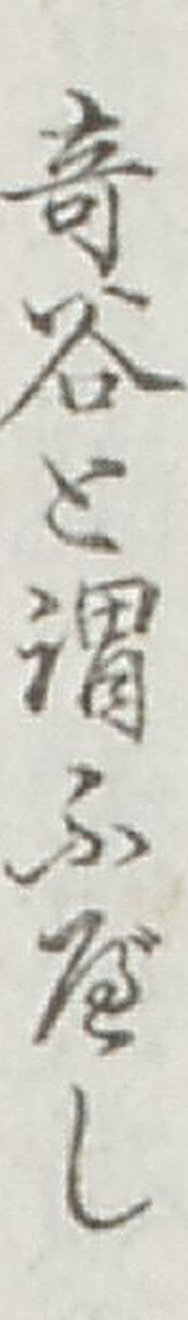奇谷と謂ふべし
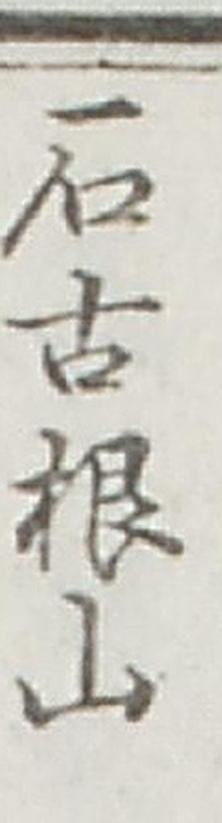石古根山
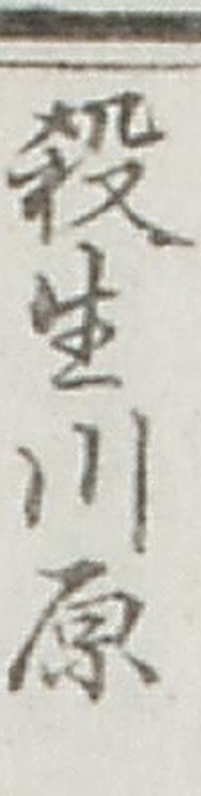殺生川原
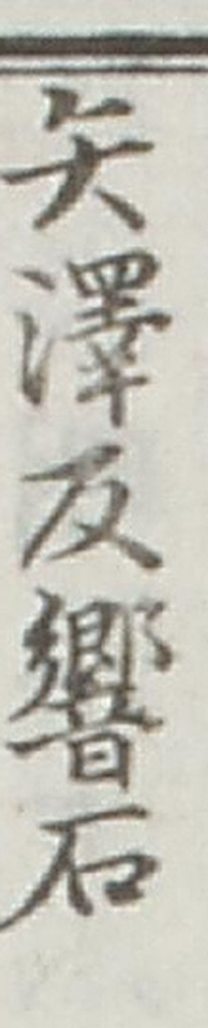矢澤反響石
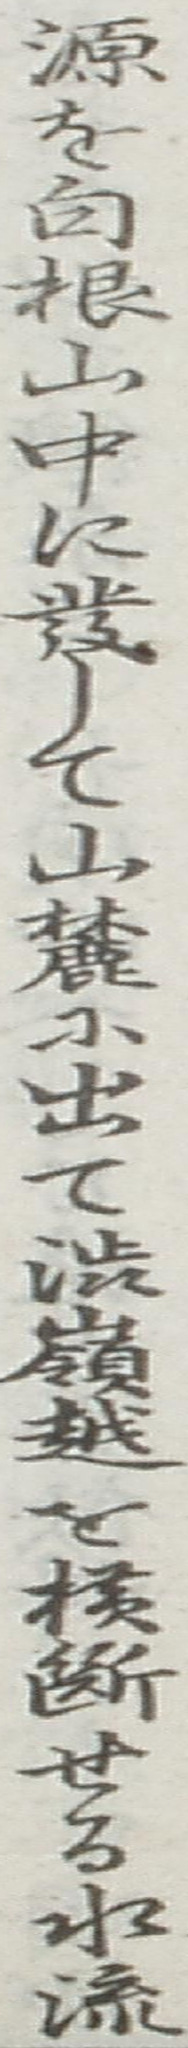源を白根山中に発して山麓に出て澁嶺越を横断せる水流
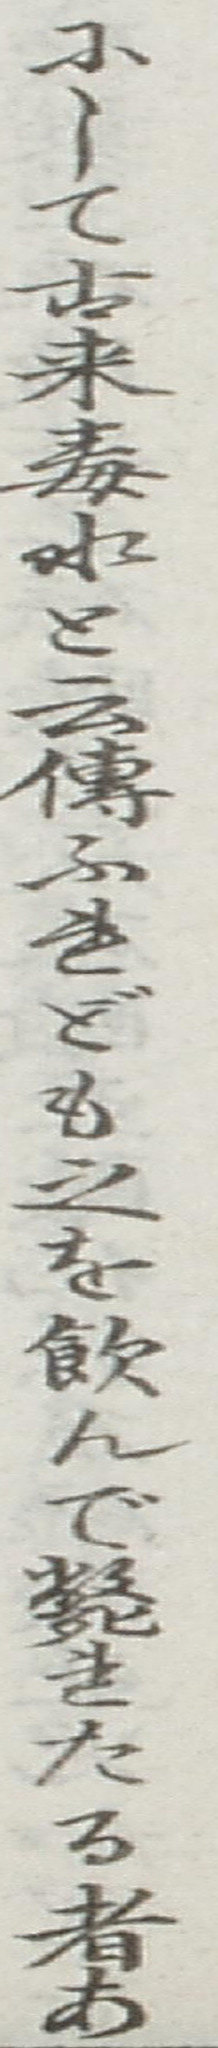にして古来毒水と云伝ふれども之を飲んで斃れたる者あ
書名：草津温泉誌　全
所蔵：東京大学地震研究所図書室 Earthquake Research Institute Library, The University of Tokyo, JAPAN
